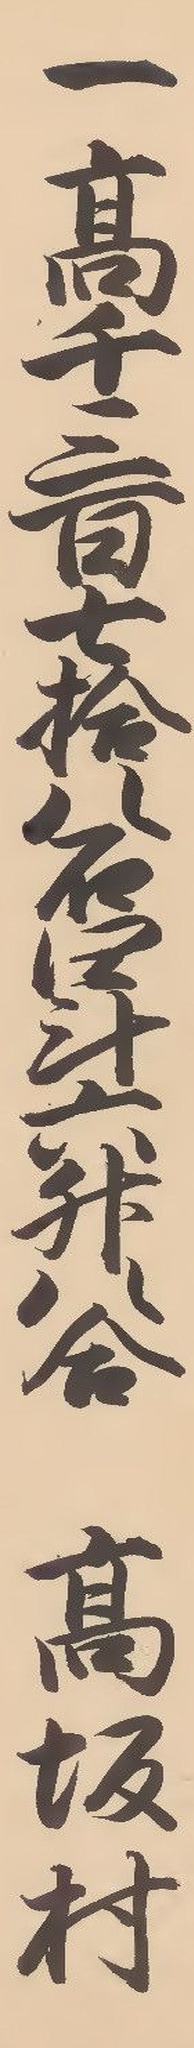一高千三百七拾八石四斗六升八合高坂村
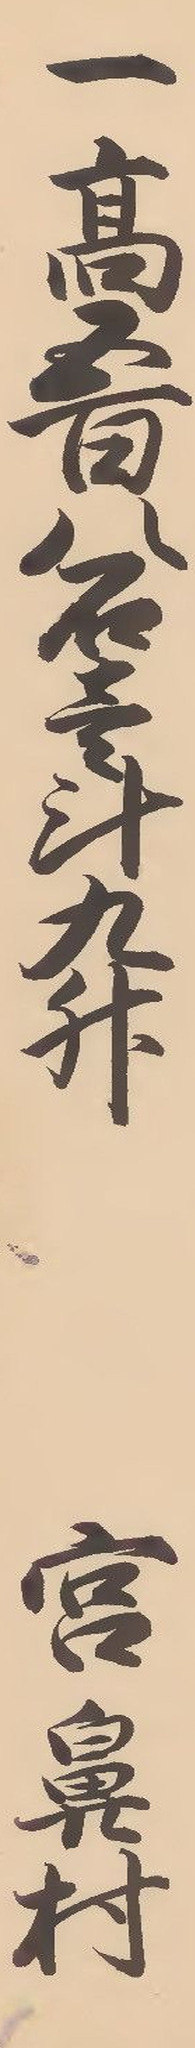一高五百八石壱斗九升宮鼻村

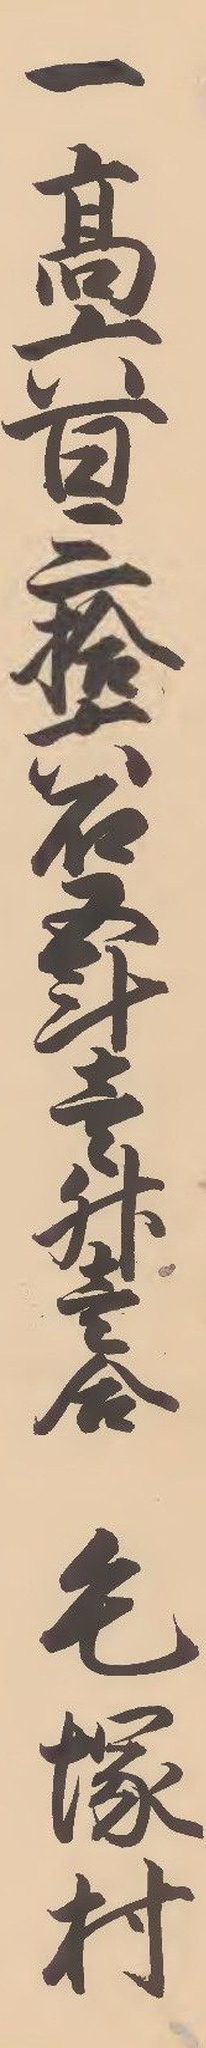一高六百三拾六石五斗壱升壱合毛塚村
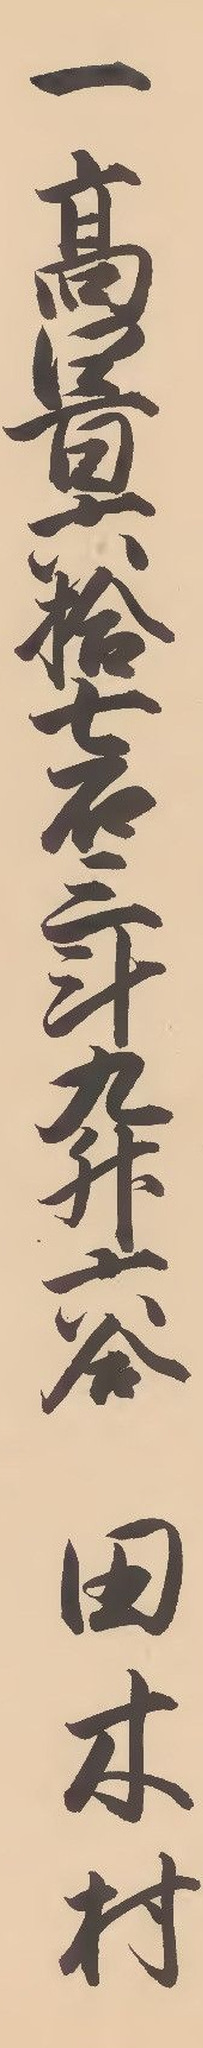一高四百六拾七石三斗九升六合田木村
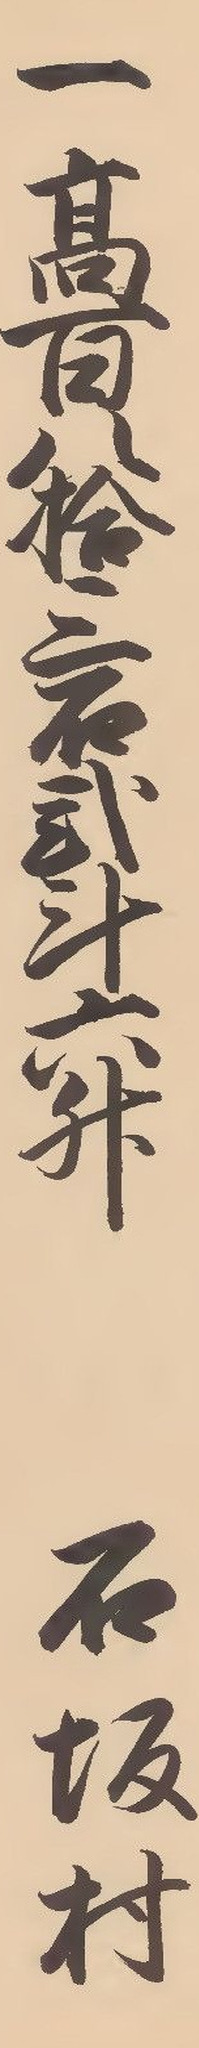一高百八拾三石弐斗六升石坂村
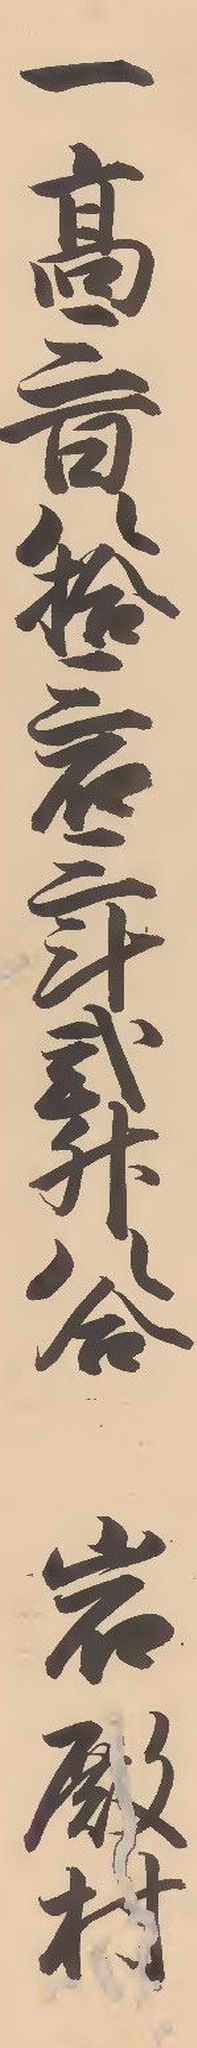一高三百八拾三石三斗弐升八合岩殿村
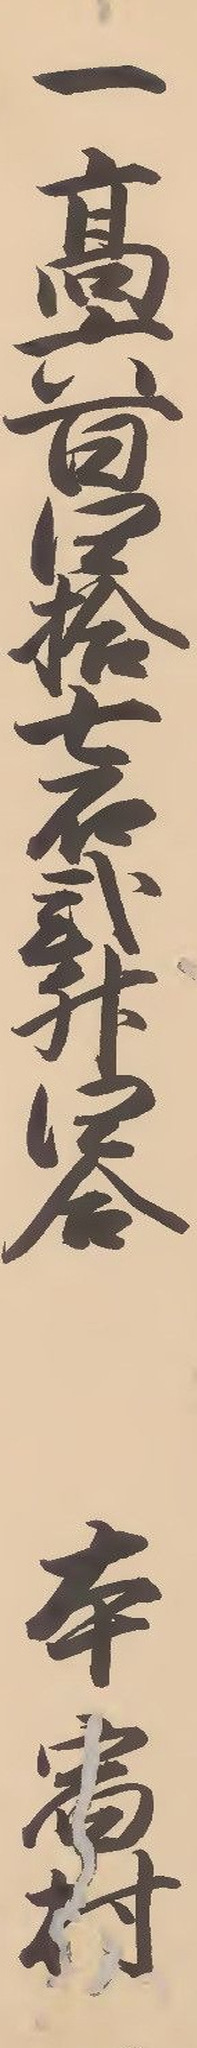一高六百四拾七石弐升四合本宿村
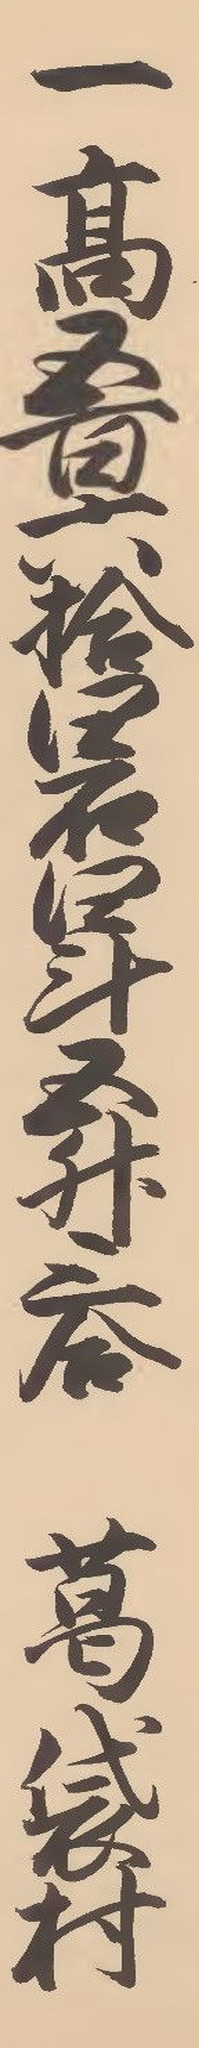一高五百六拾四石四斗五升三合葛袋村
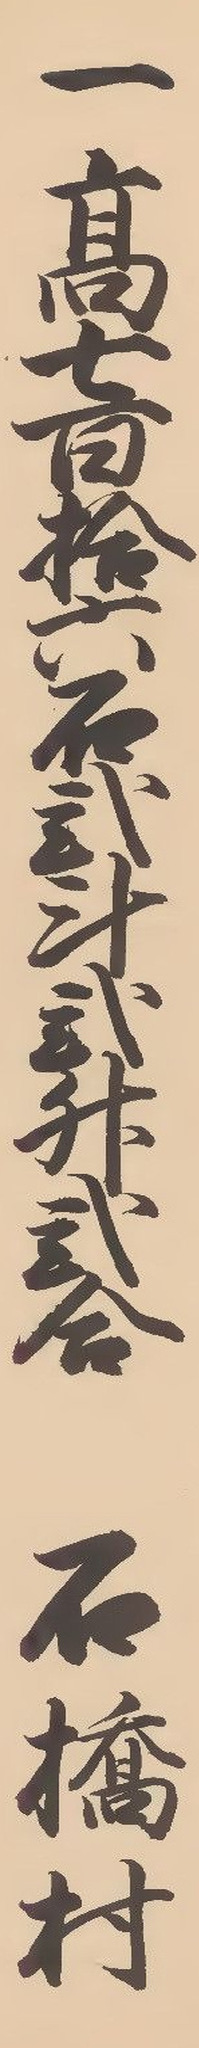一高七百拾六石弐斗弐升弐合石橋村
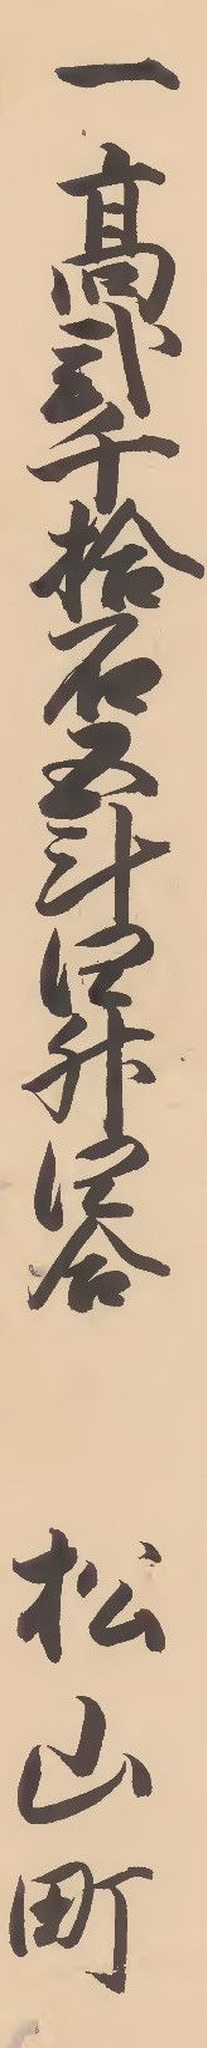一高弐千拾石五斗四升四合松山町

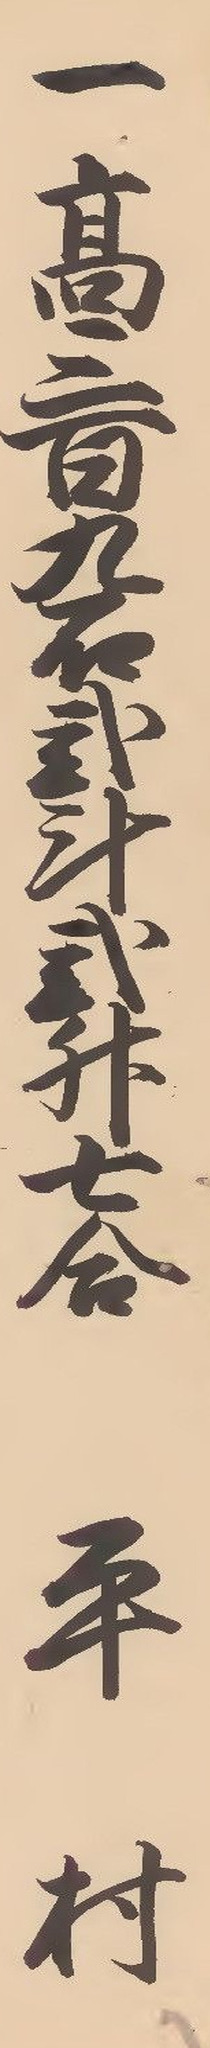一高三百九石弐斗弐升七合平村
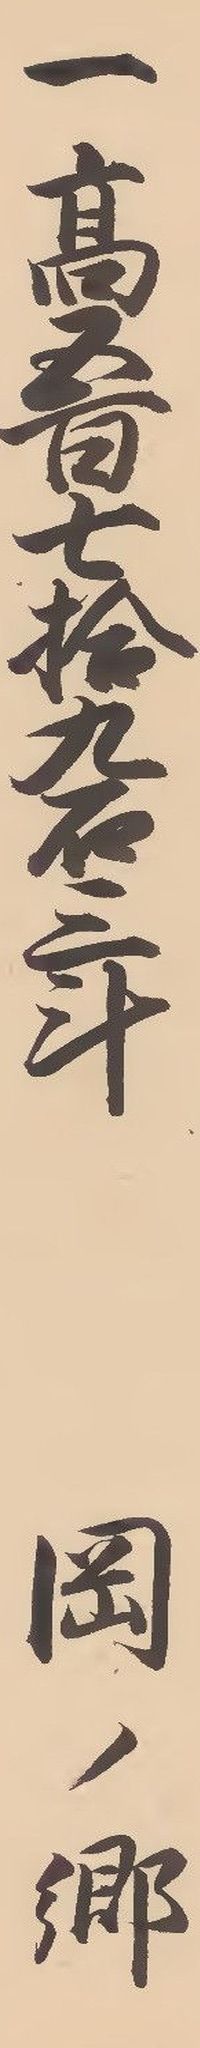一高五百七拾九石三斗岡ノ郷
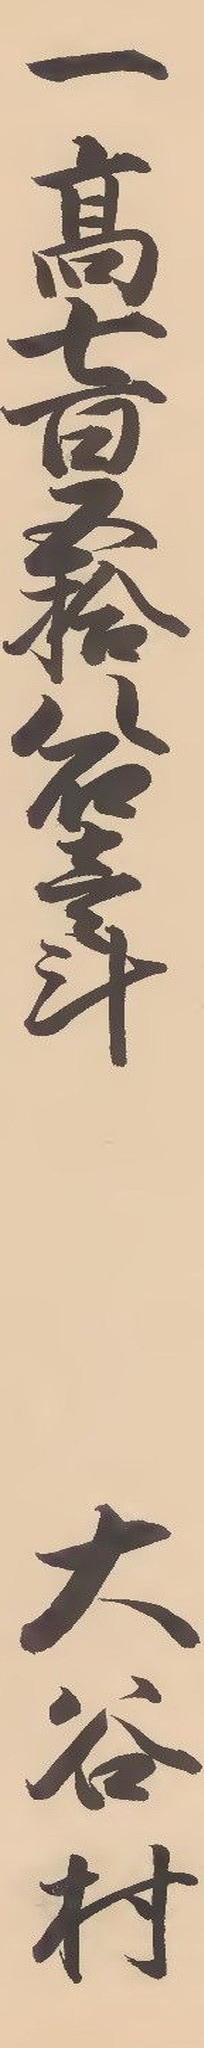一高七百五拾八石壱斗大谷村
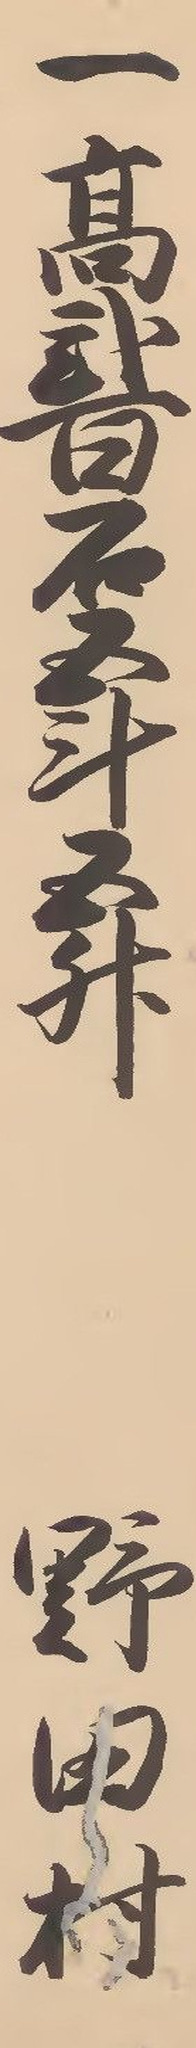一高弐百石五斗五升野田村
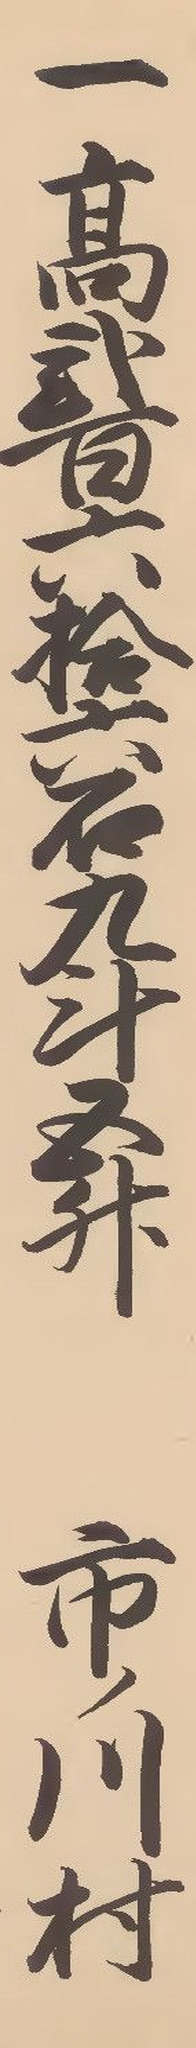一高弐百六拾六石九斗五升市ノ川村
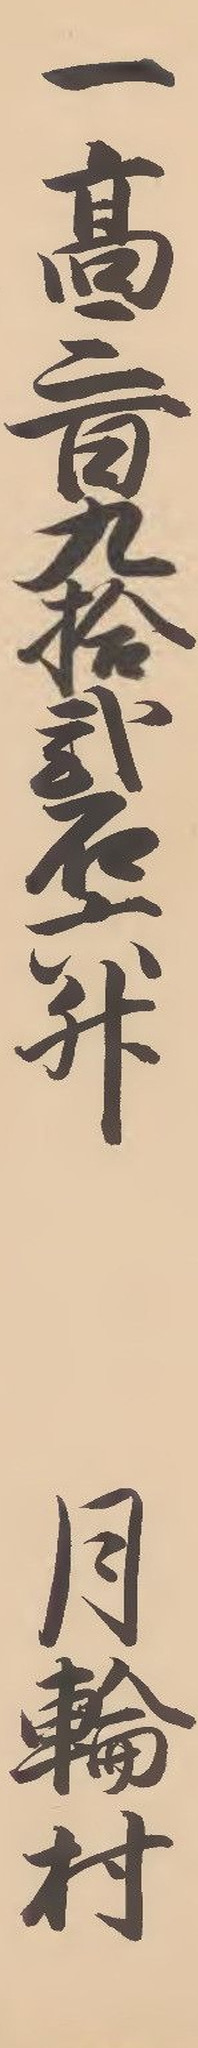一高三百九拾弐石六升月輪村
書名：武蔵国郷帳　下
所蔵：国立公文書館 National Archives of Japan
